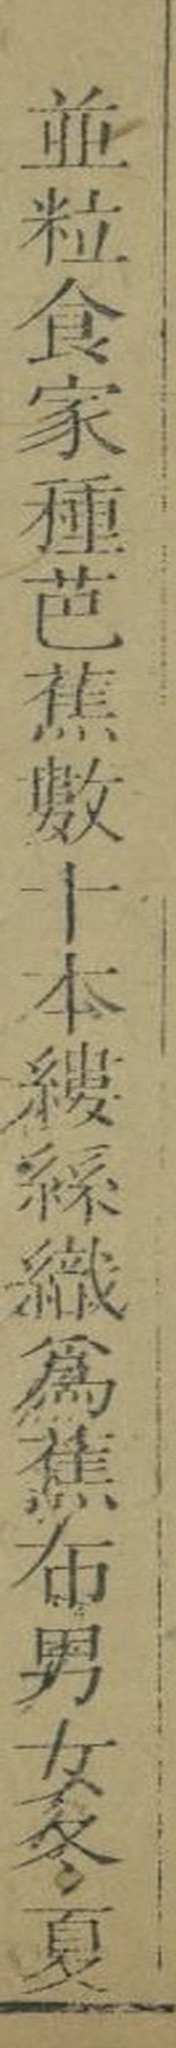並粒食家種芭蕉数十本縷糸織為蕉布男女冬夏
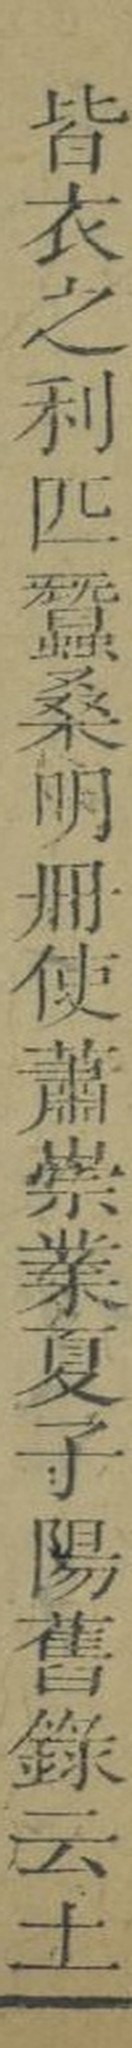皆衣之利匹蚕桑明冊使蕭崇業夏子陽旧録云土
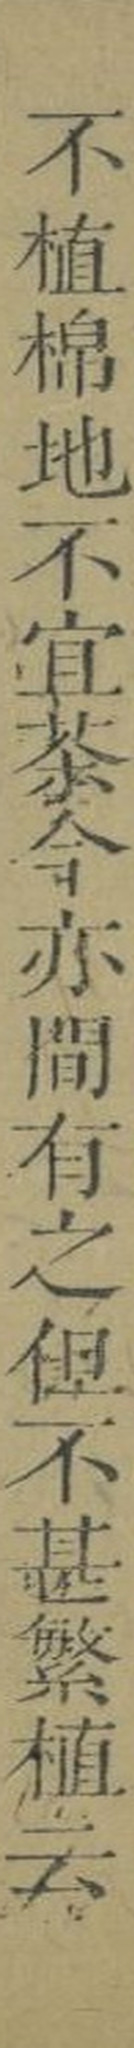不植棉地不宜茶今亦間有之但不甚繁植云
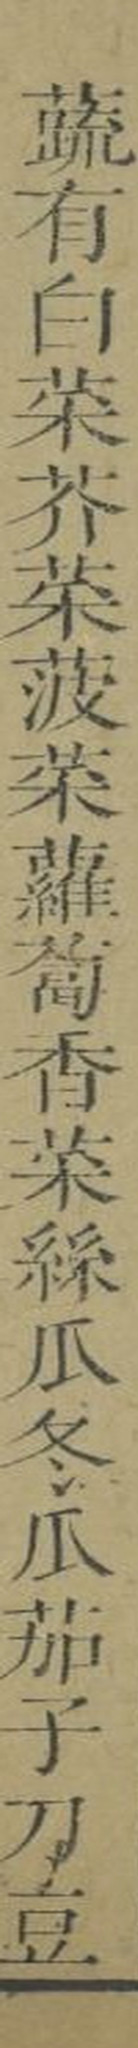蔬有白菜芥菜菠菜蘿蔔香菜糸瓜冬瓜茄子刀豆
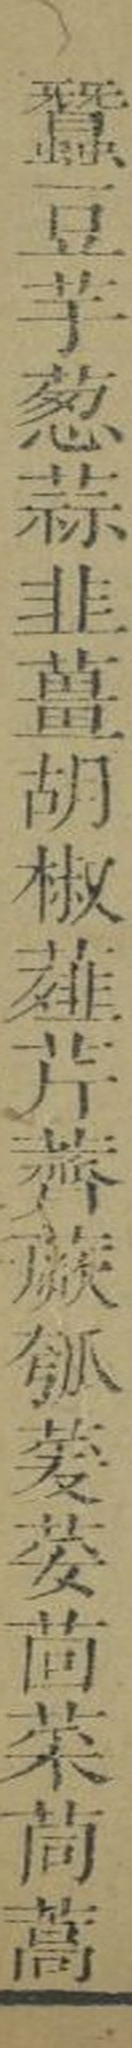蚕豆芋葱蒜韭薑胡椒薤芹薺蕨瓠萲荽茴菜茼蒿
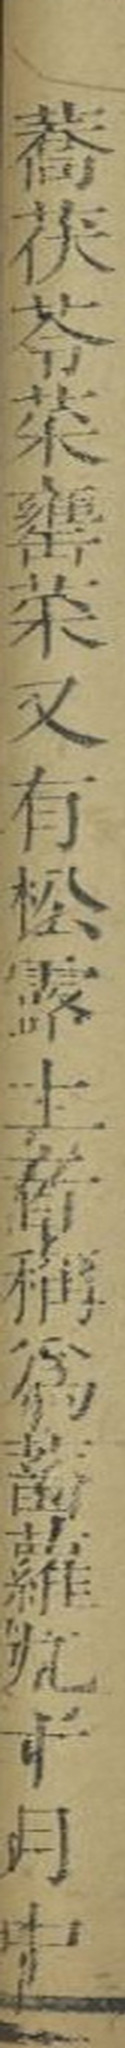蕎茯苓菜罋菜又有松露土音称為蓄蘿九十月中
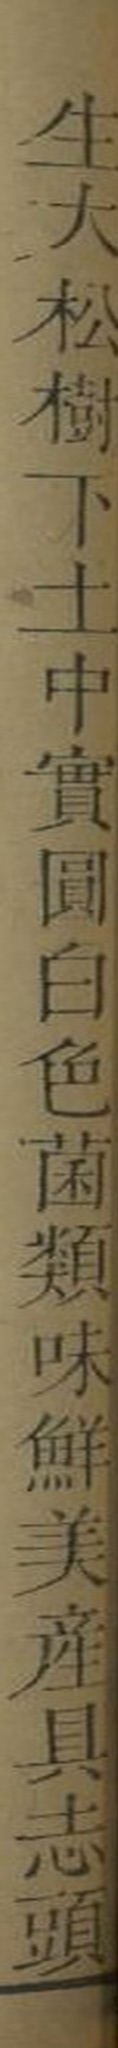生大松樹下土中実円白色菌類味鮮美産具志頭
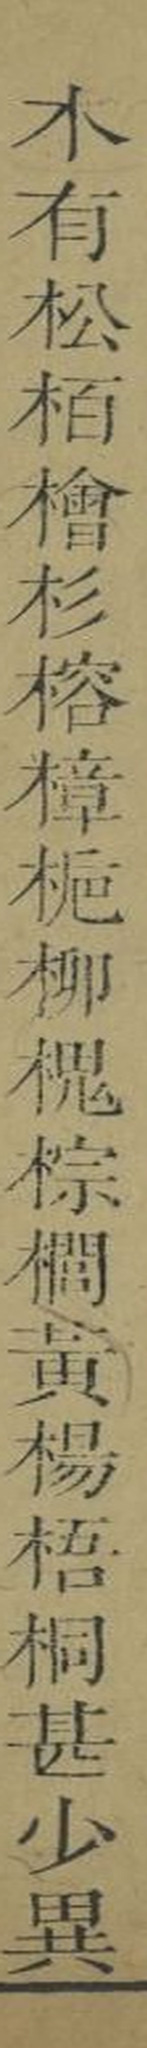木有松栢檜杉榕樟梔柳槐棕櫚黄楊梧桐甚少異
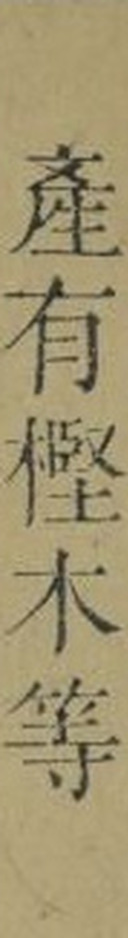産有樫木等
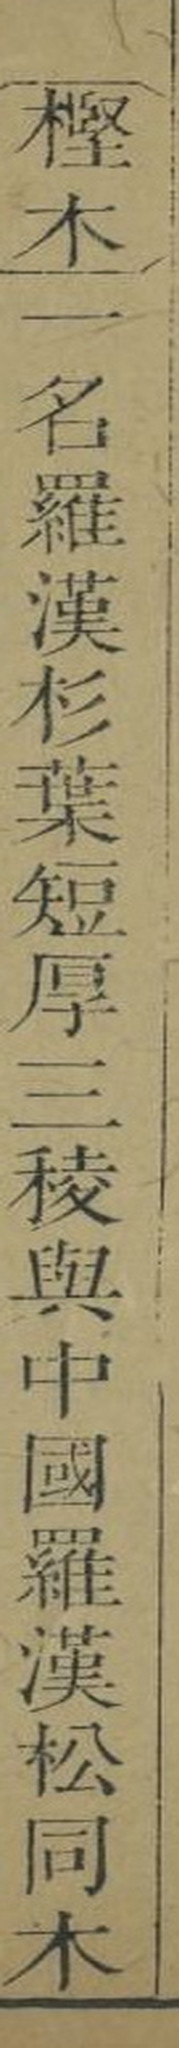[樫木]一名羅漢杉葉短厚三稜与中国羅漢松同木
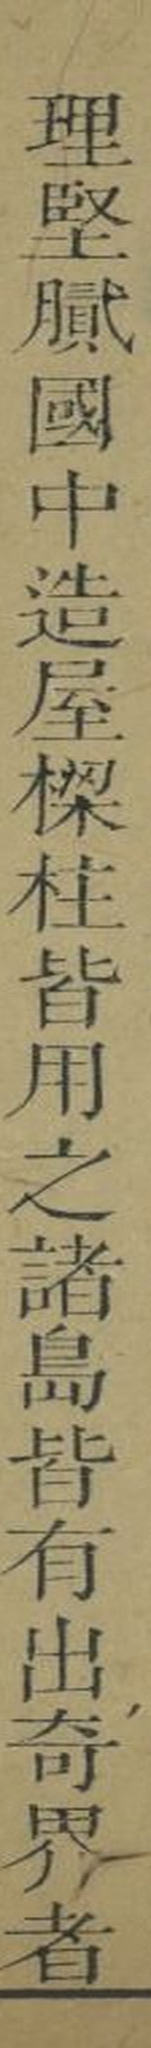理堅膩国中造屋樑柱皆用之諸島皆有出奇界者
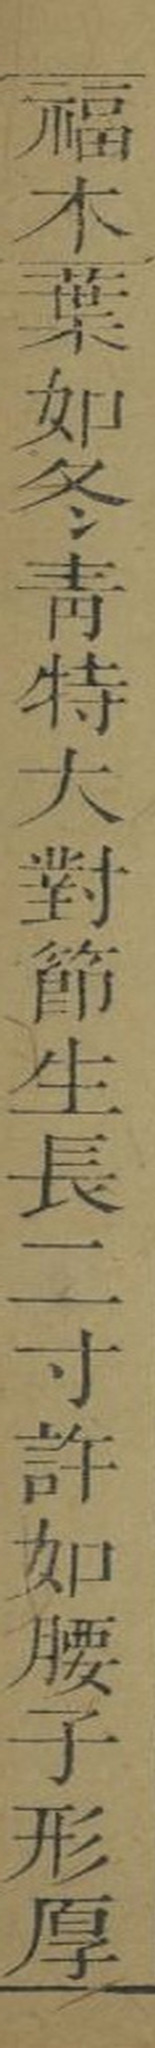[福木]葉如冬青特大対節生長二寸許如腰子形厚

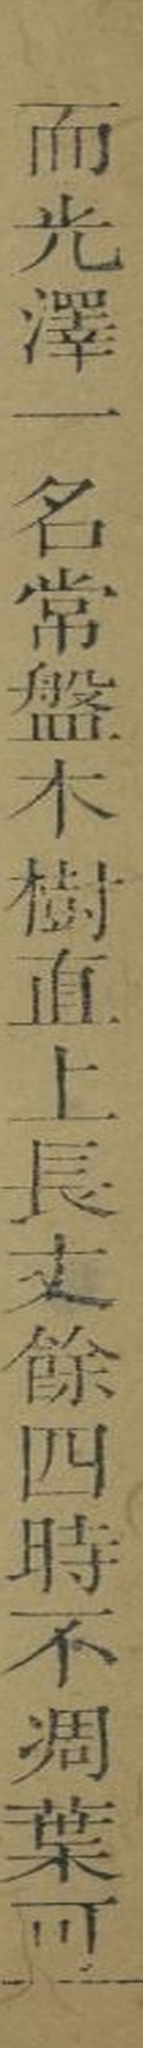而光沢一名常盤木樹直上長丈余四時不凋葉可
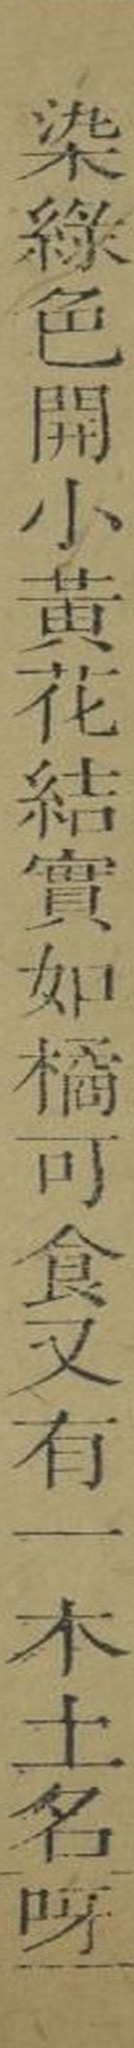染緑色開小黄花結実如橘可食又有一木土名[呀
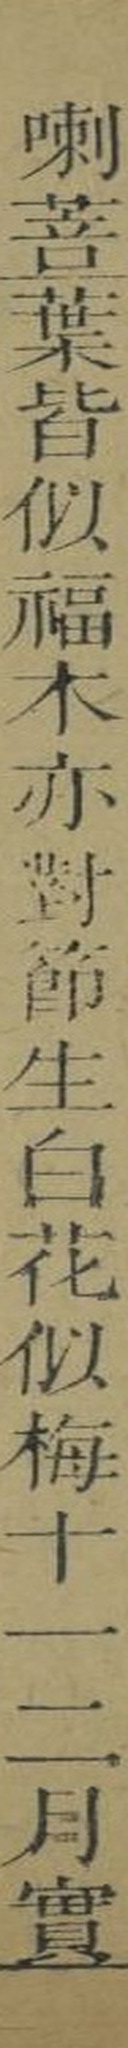喇菩]葉皆似福木亦対節生白花似梅十一二月実
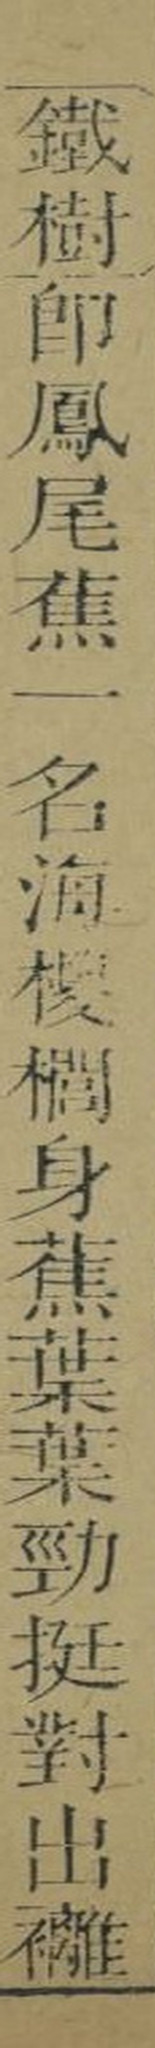[鉄樹]即鳳尾蕉一名海㯶櫚身蕉葉葉勁挺対出䙰
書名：中山伝信録 巻六
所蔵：University of the Ryukyus Library
